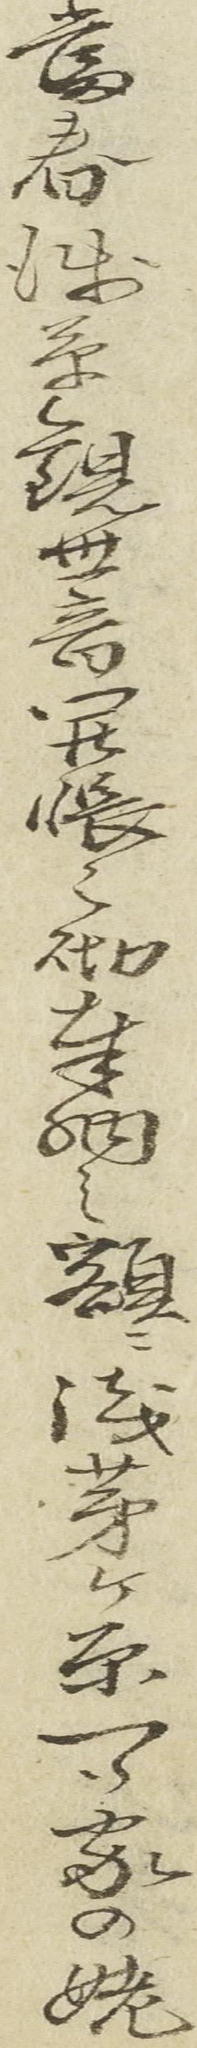当春浅草観世音開帳之砌奉納之額ニ浅茅ケ原一ツ家の姥
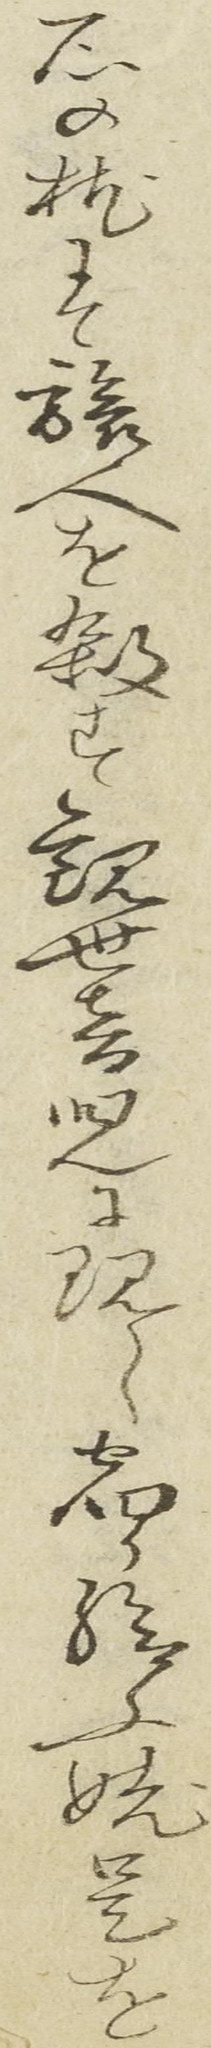石の杭にて旅人を殺す観世音児に現し宿り給ふ姥是を
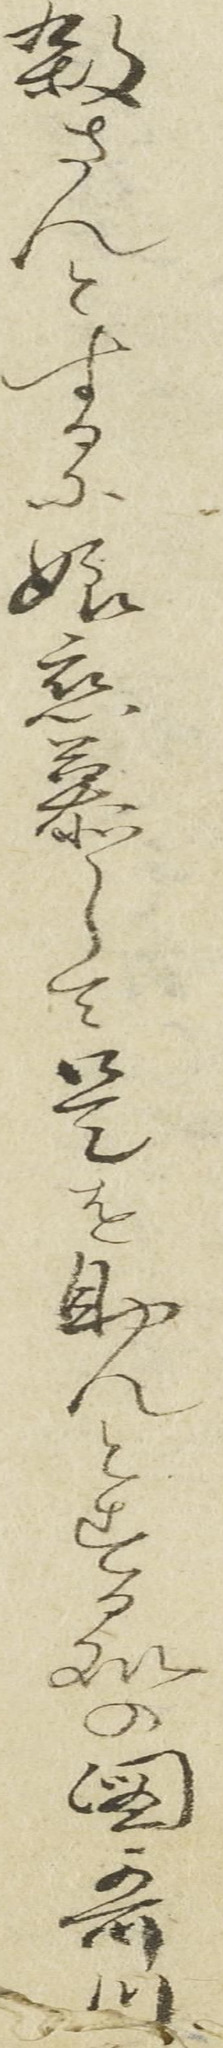殺さんとするに娘慈慕して是を助んとする処の図歌川
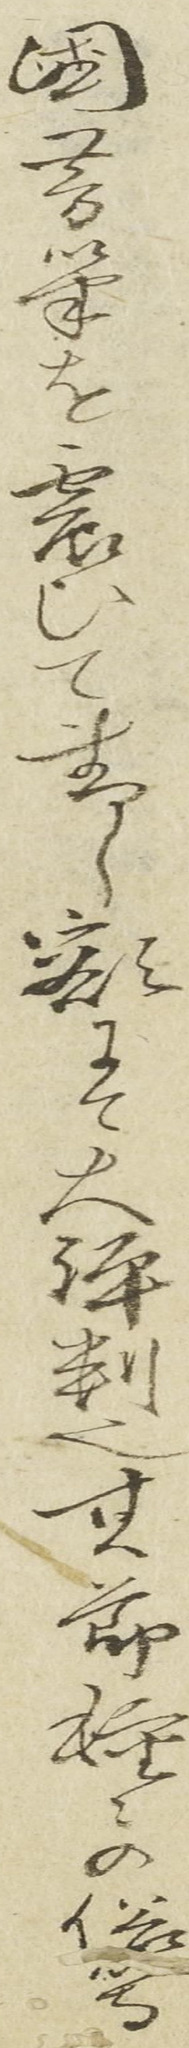国芳筆を震ひて書し額にて大評判也其節種々の俗
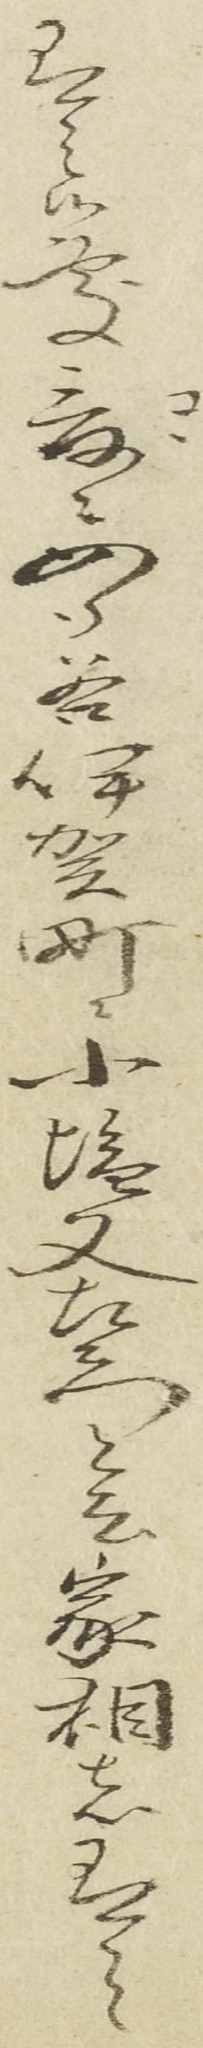有之候處爰コゝニ四ツ谷伊賀町ニ小塩又左衛門と云家相者有之
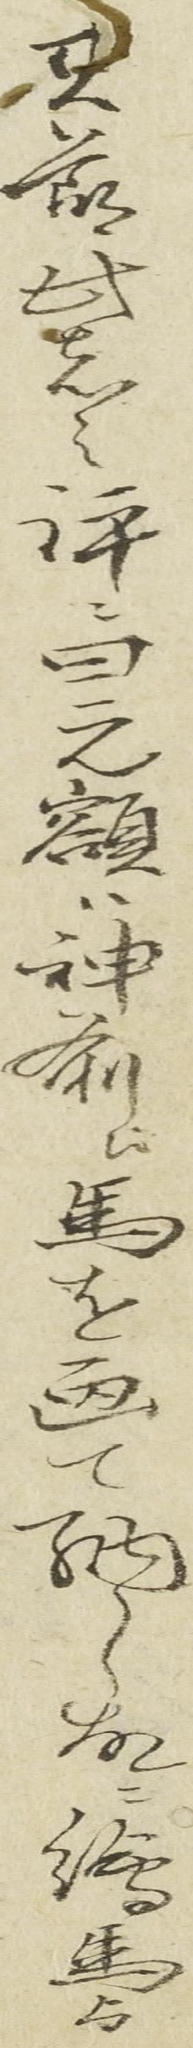其節此者之評ニ曰元額ハ神前え馬を画て納し故ニ絵馬と
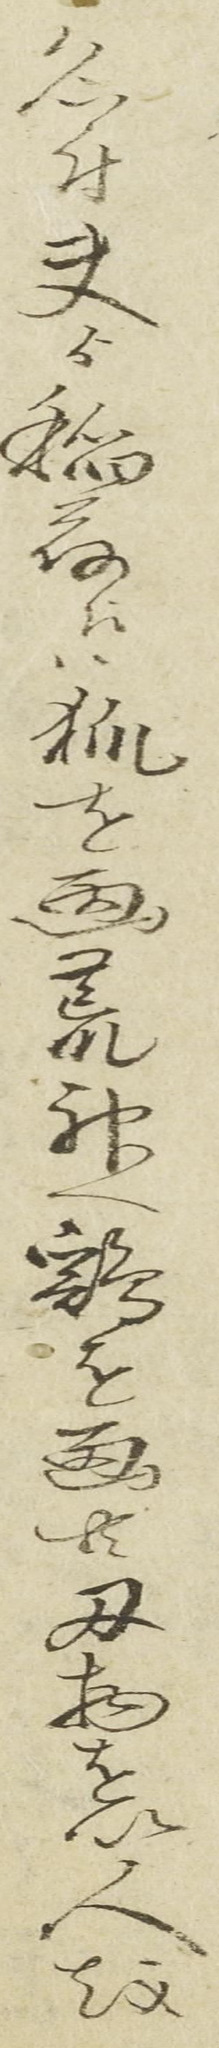名付夫ゟ稲荷エハ狐を画荒神へ鶏を画共刃物を以人を
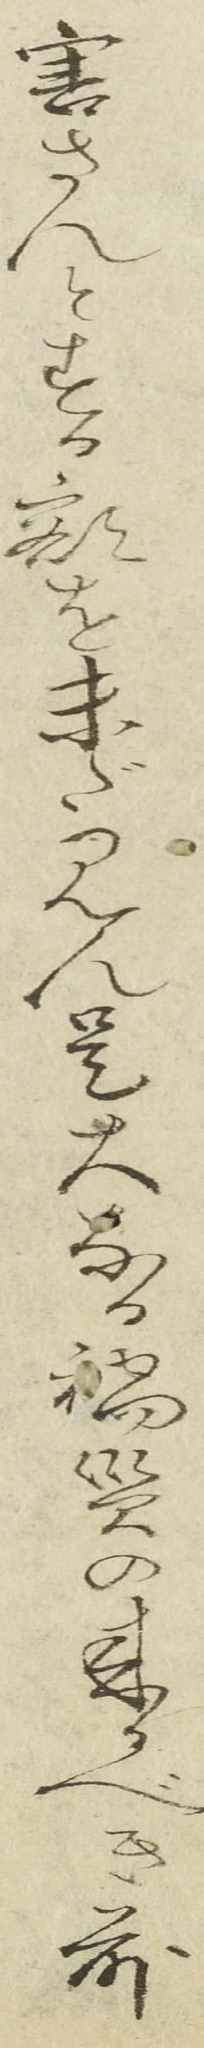害さんとする額を未だ見ん是大なる禍災の来るべき前
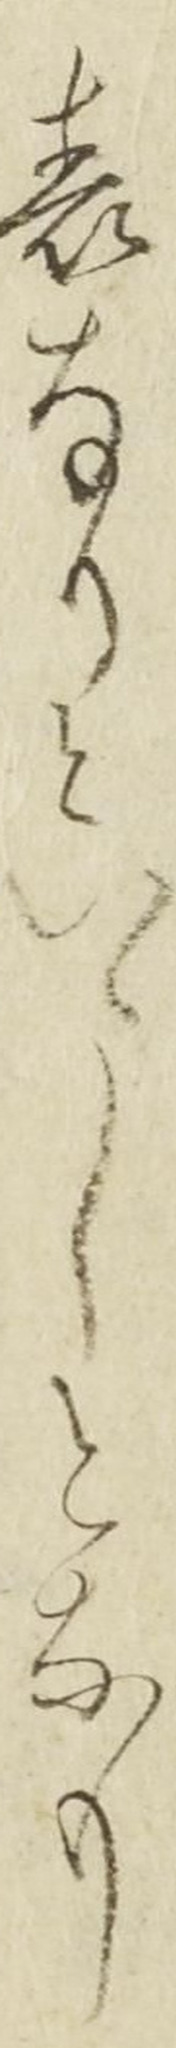表なりというとなり
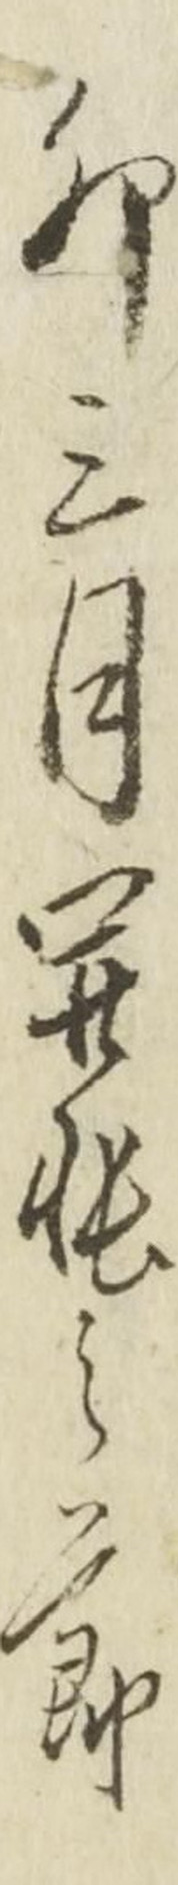卯三月開帳之節
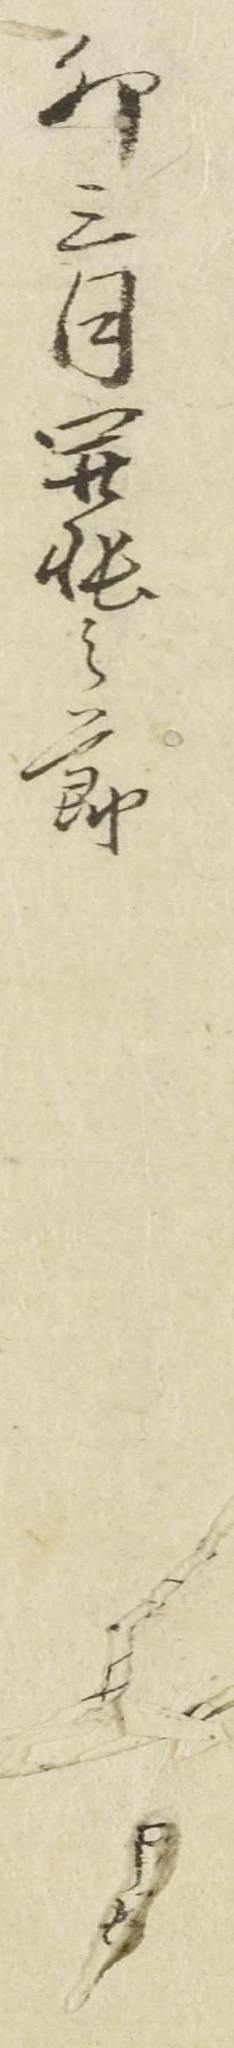卯三月開帳之節
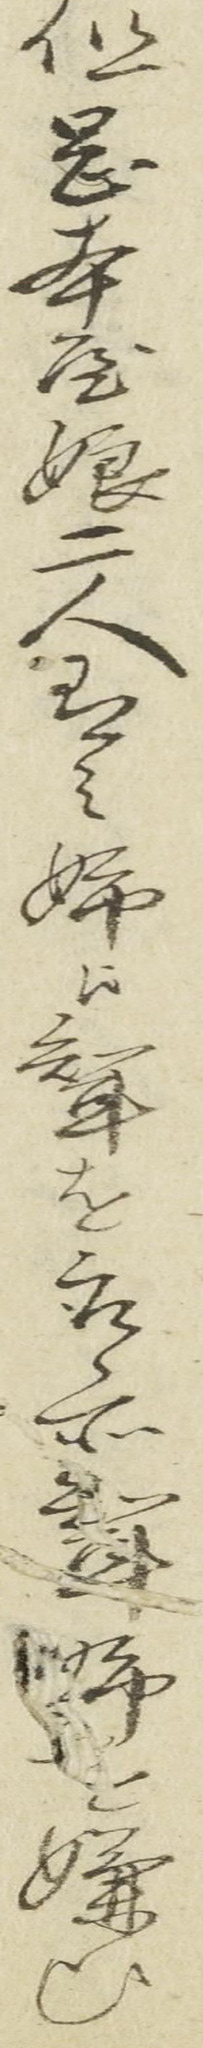但岡本屋娘二人有之婦え聟を取候所聟婦を嫌ひ
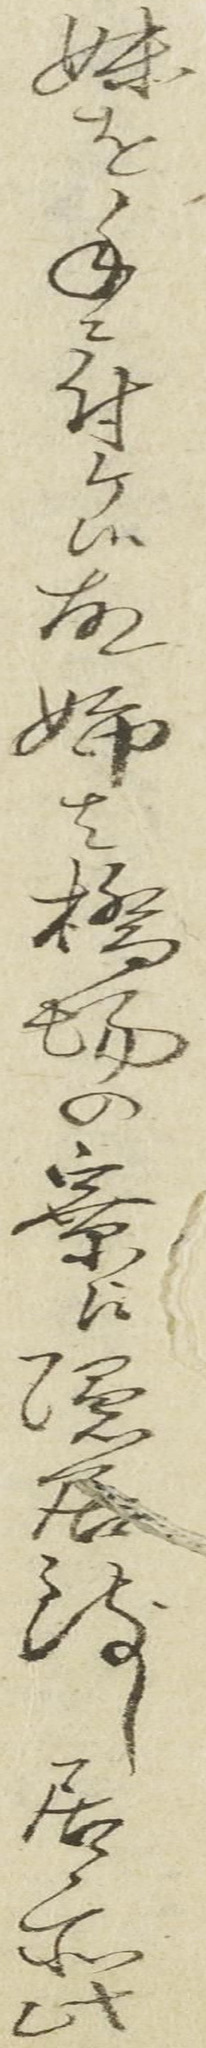妹を手二付ケ候故姉は橋場の寮え隠居致し居候所此
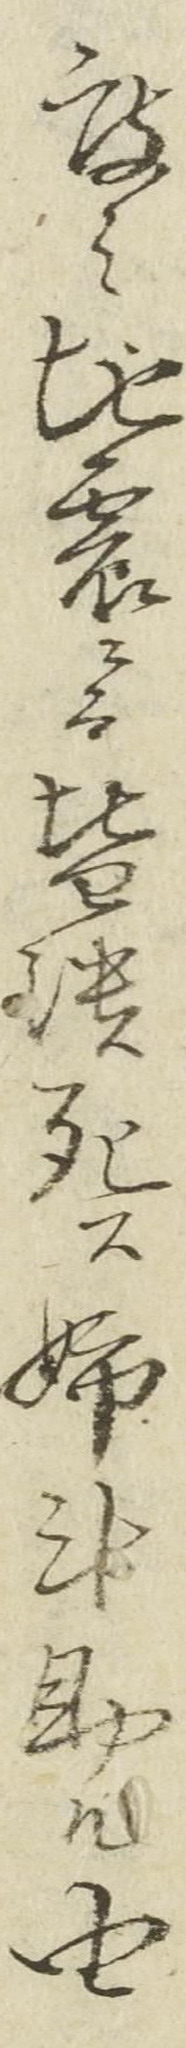度之地震ニ而皆潰死ス姉斗助る由
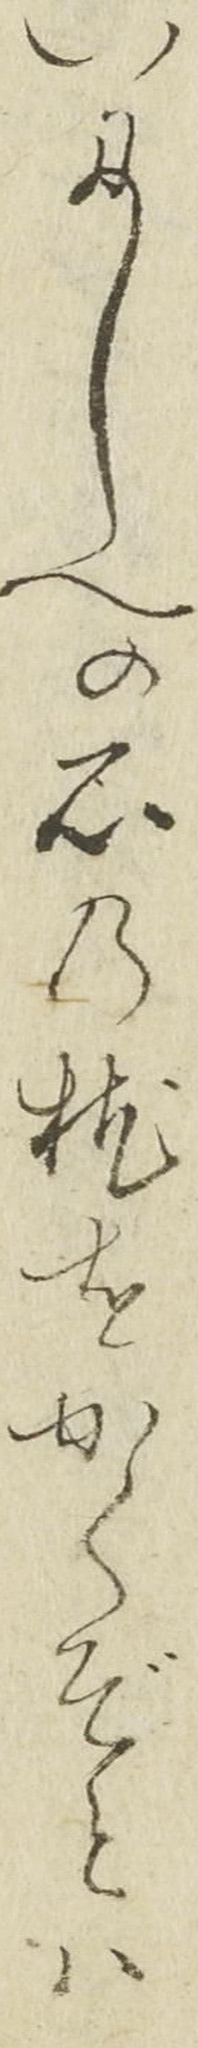いにしへの石乃杭をかくぞとハ
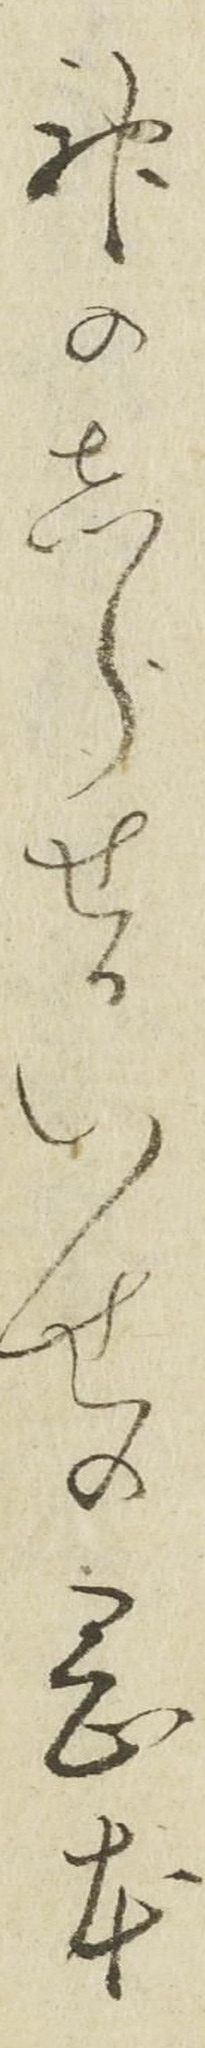神のしらせるいせの岡本
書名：安政二乙卯年十月二日大地震之事
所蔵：東京大学地震研究所図書室 Earthquake Research Institute Library, The University of Tokyo, JAPAN
